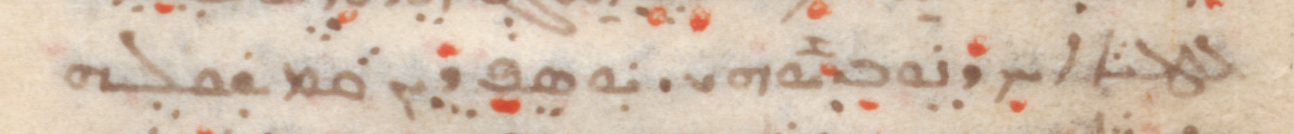ܠܛܠܝܐ ܐܝܟ ܕܢܘܒܕܝܘܗܝ. ܝܘܣܦ ܕܝܢ ܩܡ ܫܩܠܗ
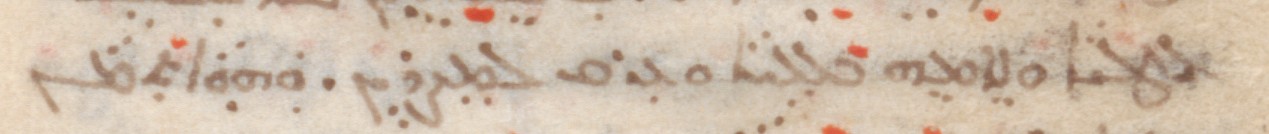ܠܛܠܝܐ ܘܠܐܡܗ ܒܠܠܝܐ ܘܥܪܩ ܠܡܨܪܝܢ. ܘܗܘܐ ܬܡܢ
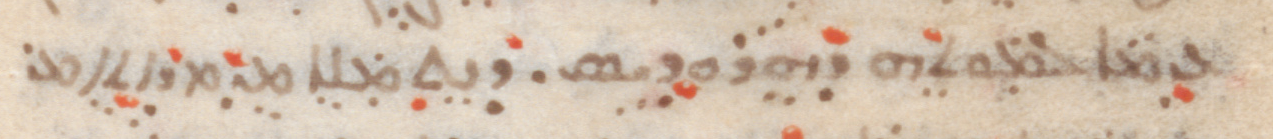ܥܕܡܐ ܠܡܘܬܗ ܕܗܪܘܕܝܣ. ܕܢܬܡܠܐ ܡܕܡ ܕܐܬܐܡܪ
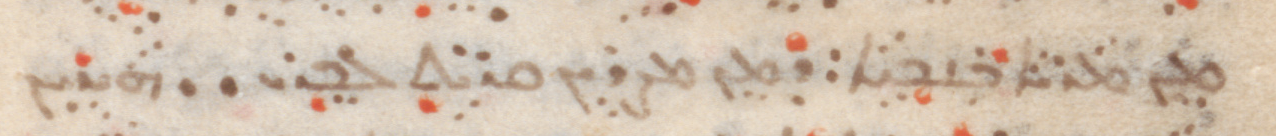ܡ̣ܢ ܡܪܝܐ ܒܢܒܝܐ: ܕܡ̣ܢ ܡܨܪܝܢ ܩܪܝܬ ܠܒܪܝ.. ܗܝܕܝܢ
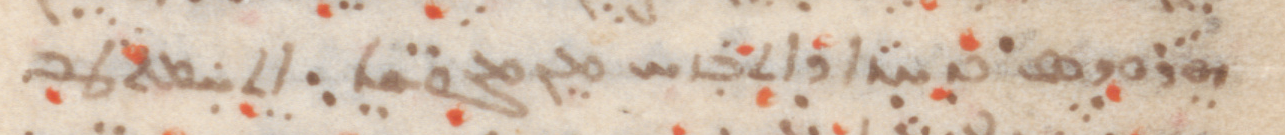ܗܪܘܕܣ ܟܕ ܚ̣ܙܐ ܕܐܬܒܙܚ ܡ̣ܢ ܡܓܘ̈ܫܐ܆ ܐܬܚܡܬ ܛܒ
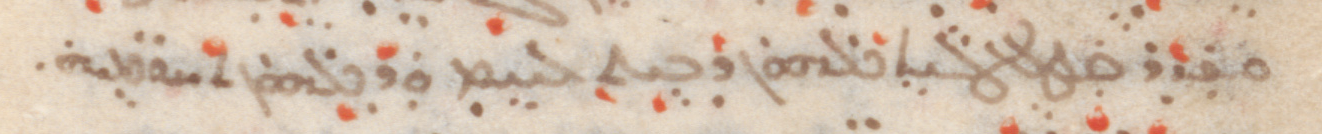ܘܫܕܪ ܩܛܠ ܛܠܳܝ̈ܐ ܟܠܗܘܢ ܕܒܝܬ݂ܠܚܡ ܘܕܟܠܗܘܢ ܬܚܘ̈ܡܝܗ̇.
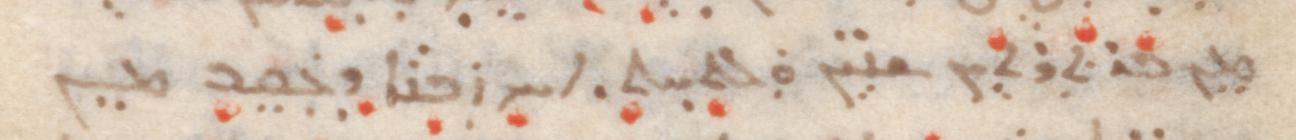ܡ̣ܢ ܒܪ ܬܪܬܝܢ ܫܢܝ̈ܢ ܘܠܬܚܬ. ܐܝܟ ܙܒܢܐ ܕܥܩܒ ܡ̣ܢ
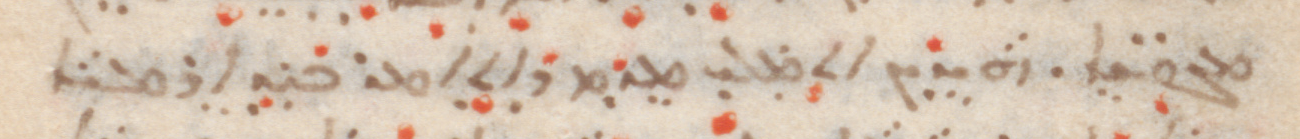ܡܓܘ̈ܫܐ. ܗܝܕܝܢ ܐܬܡܠܝ ܡܕܡ ܕܐܬܐܡܪ ܒܝܕ ܐܪܡܝܐ
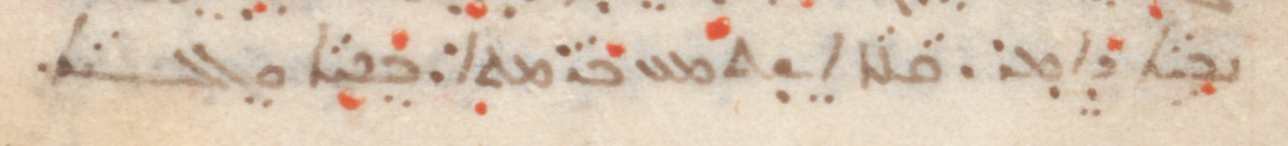ܢܒܝܐ ܕܐܡ̣ܪ. ܩܠܐ ܐܫܬܡܥ ܒܪܡܬܐ܇ ܒܟܝܐ ܘܐܠܝܐ
